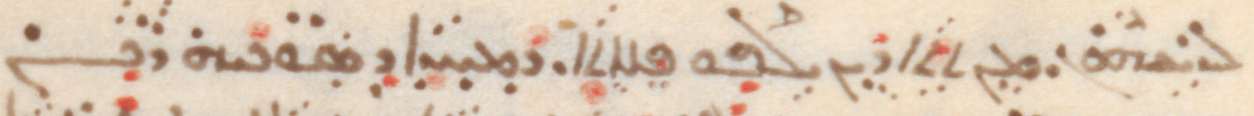ܠܪܫܗܘܢ. ܡ̣ܢ ܬܬܐ ܕܝܢ ܝܠܦܘ ܦܠܐܬܐ. ܕܡܚܕܐ ܕܣܘ̈ܟܝܗ̇ ܪ̈ܟܢ
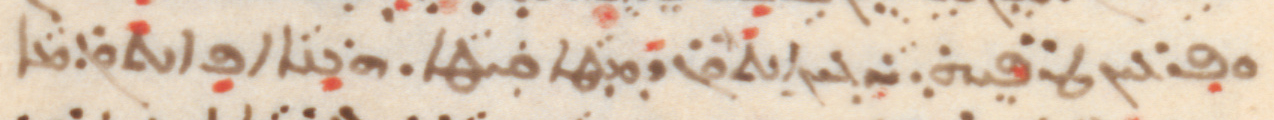ܘܦܪܥܝܢ ܛܪ̈ܦܝܗ̇: ܝܕܥܝܢ ܐܢܬܘܢ ܕܡܛܐ ܩܝܛܐ. ܗܟܢܐ ܐܦ ܐܢܬܘܢ ܡܐ
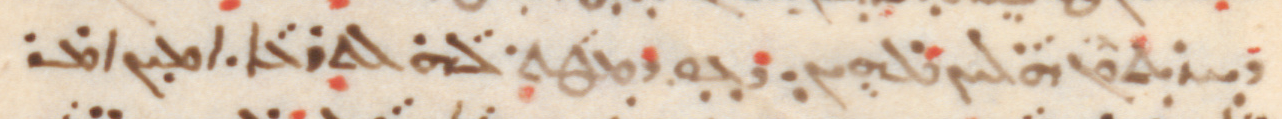ܕܚܙܝܬܘܢ ܗܠܝܢ ܟܠܗܝܢ: ܕܥܘ ܕܡܛܬ݀ ܠܗ̇ ܠܬܪܥܐ. ܐܡܝܢ ܐܡ̇ܪ
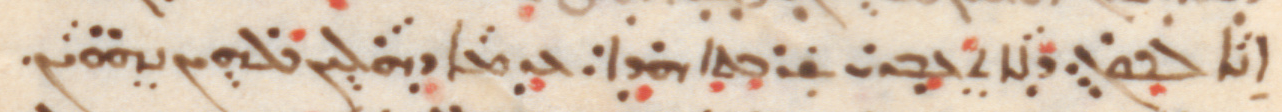ܐܢܐ ܠܟܘܢ: ܕܠܐ ܬܥܒܪܝ ܫܪܒܬܐ ܗܕܐ܇ ܥܕܡܐ ܕܗܠܝܢ ܟܠܗܝܢ ܢܗܘܝܢ.
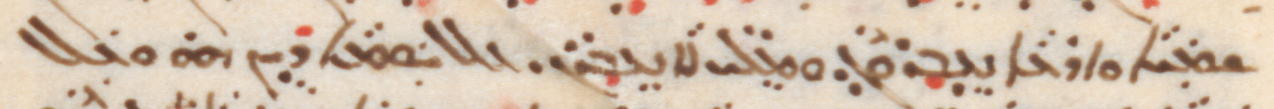ܫܡܝܐ ܘܐܪܥܐ ܢܥܒܪܘܢ: ܘܡ̈ܠܝ ܠܐ ܢܥܒܪܢ. ܥܠ ܝܘܡܐ ܕܝܢ ܗ̇ܘ ܘܥܠ
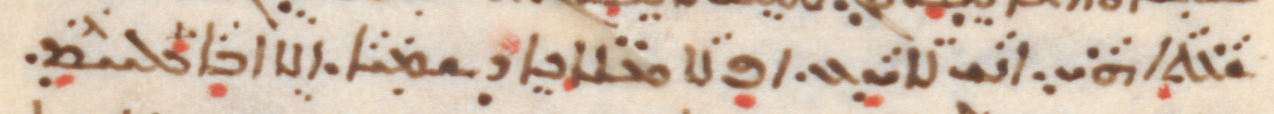ܫܥܬܐ ܗ̇ܝ܆ ܐܢܫ ܠܐ ܝܕܥ. ܐܦ ܠܐ ܡ̈ܠܐܟܐ ܕܫܡܝܐ. ܐܠܐ ܐܒܐ ܒܠܚܘܕ.
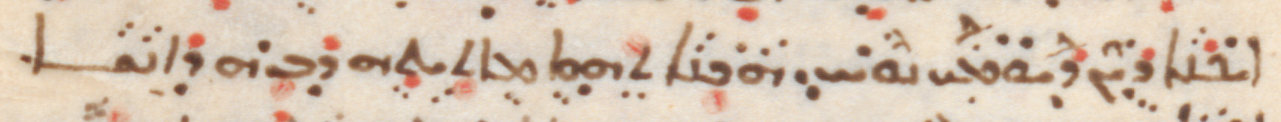ܐܝܟܢܐ ܕܝܢ ܕܝܘ̈ܡܝ ܢܘܚ܆ ܗܟܢܐ ܬܗܘܐ ܡܐܬܝܬܗ ܕܒܪܗ ܕܐܢܫܐ.
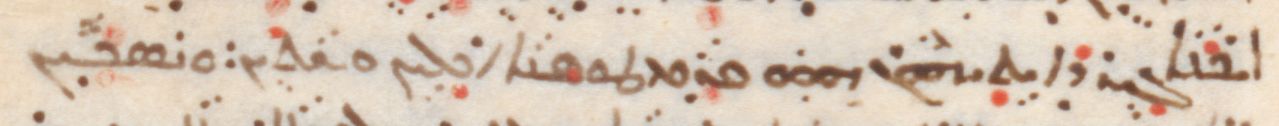ܐܝܟܢܐ ܓܝܪ ܕܐܝܬܝܗܘܢ ܗܘܘ ܩܕܡ ܛܘܦܢܐ ܐܟܠܝܢ ܘܫܬܝܢ: ܘܢܣܒܝܢ
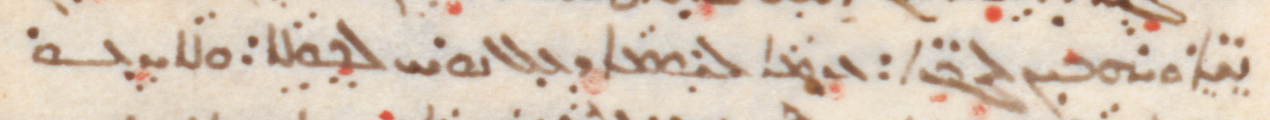ܢܫ̈ܐ ܘܝܗܒܝܢ ܠܓܒܪ̈ܐ: ܥܕܡܐ ܠܝܘܡܐ ܕܥ̣ܠ ܢܘܚ ܠܟܘܠܐ: ܘܠܐ ܝܕܥܘ
